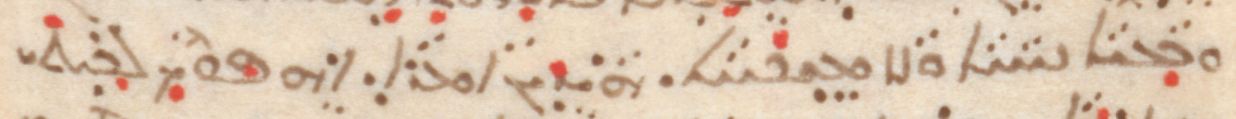ܘܒܥܝܐ ܢܝܚܐ ܘܠܐ ܡܫܟܚܐ. ܗܝܕܝܢ ܐܡܪܐ܆ ܐܗܦܘܟ ܠܒܝܬܝ
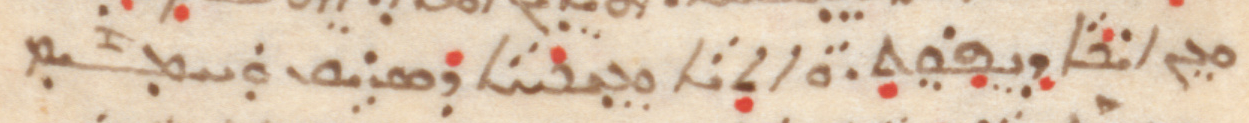ܡܢ ܐܝܟܐ ܕܢܦܩܬ. ܘܐܬܝܐ ܡܫܟܚܐ ܕܣܪܝܩܢ ܘܚܡܝܡ
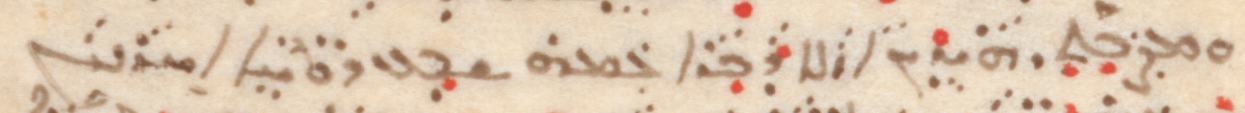ܘܡܨܒܬ. ܗܝܕܝܢ ܐܙܠܐ ܕܒܪܐ ܥܡܗ̇ ܫܒܥ ܪ̈ܘܚܐ ܐܚܪܢܝܢ
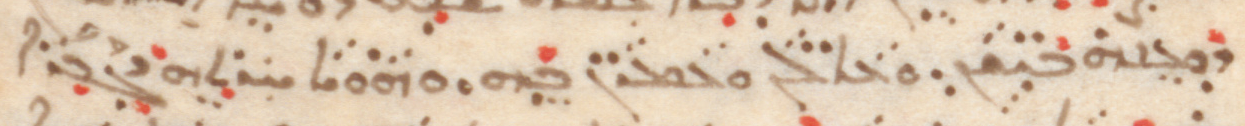ܕܡܢܗ ܒܝ̈ܫܢ܆ ܘܥܐ̈ܠܢ ܘܥܡܪ̈ܢ ܒܗ. ܘܗܘܝܐ ܚܪܬܗ ܕܓܒܪܐ
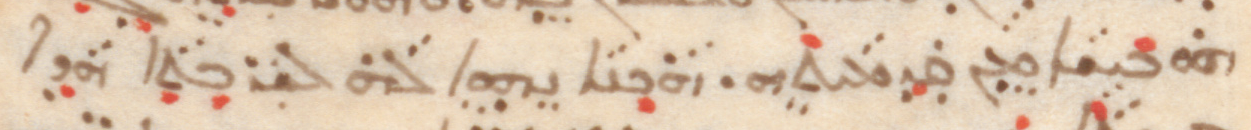ܗ̇ܘ ܒܝܫܐ ܡ̣ܢ ܩܕܡܝܬܗ. ܗܟܢܐ ܢܗܘܐ ܠܗ̇ ܠܫܪܒܬܐ ܗܕܐ
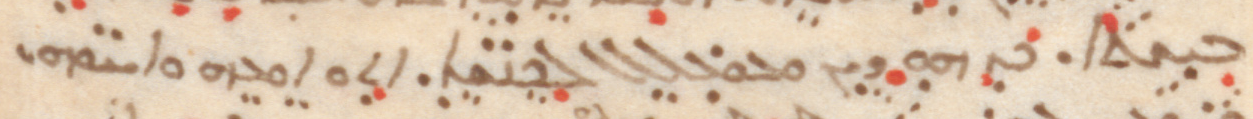ܒܝܫܬܐ. ܟܕ ܗ̣ܘ ܕܝܢ ܡܡܠܠ ܠܟܢ̈ܫܐ. ܐܬ̣ܘ ܐܡܗ ܘܐܚ̈ܘܗܝ
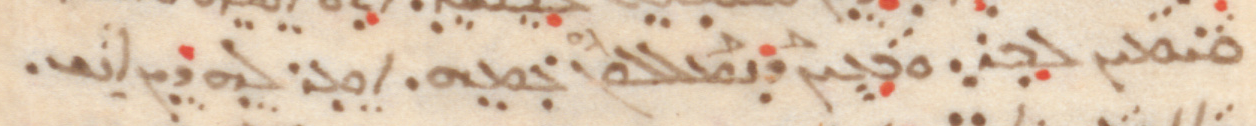ܩܝܡܝܢ ܠܒܪ܆ ܘܒܥܝܢ ܕܢܡܠܠܘܢ ܥܡܗ. ܐܡ̣ܪ ܠܗ ܕܝܢ ܐܢܫ.
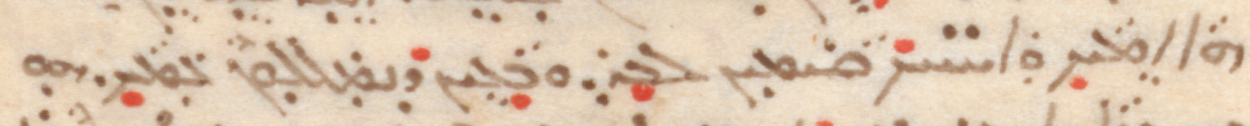ܗܐ ܐܡܝܟ ܘܐܚ̈ܝܟ ܩܝܡܝܢ ܠܒܪ܆ ܘܒ̇ܥܝܢ ܕܢܡܠܠܘܢ ܥܡܟ. ܗ̣ܘ
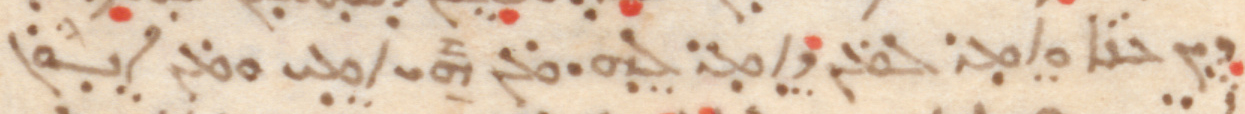ܕܝܢ ܥܢܐ ܘܐܡ̣ܪ ܠܡ̇ܢ ܕܐܡ̣ܪ ܠܗ. ܡ̇ܢ ܗܝ ܐܡܝ ܘܡ̇ܢ ܐܢܘܢ
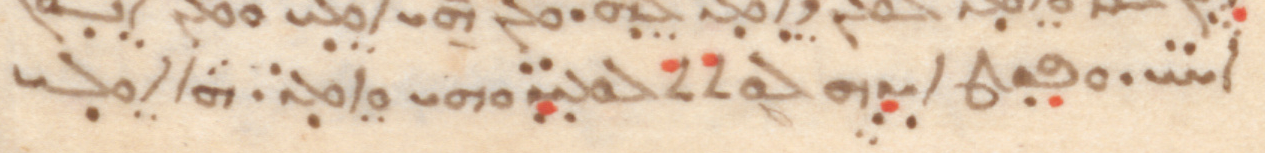ܐܚ̈ܝ. ܘܦܫ̣ܛ ܐܝܕܗ ܠܘܬ ܬܠܡܝܕ̈ܘܗܝ ܘܐܡ̣ܪ: ܗܐ ܐܡ̣ܝ
